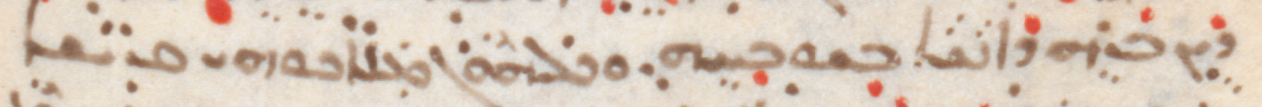ܕܝܢ ܒܪܗ ܕܐܢܫܐ ܒܫܘܒܚܗ. ܘܟܠܗܘܢ ܡܠܐ̈ܟܘܗܝ ܩܕܝ̈ܫܐ
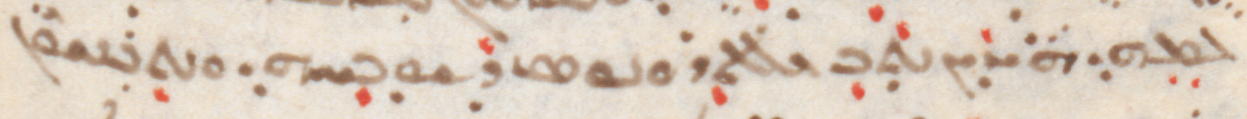ܥܡܗ. ܗܝܕܝܢ ܝܬܒ ܥܠ ܬܪܢܘܣ ܕܫܘܒܚܗ܆ ܘܢܬܟܢܫܘܢ
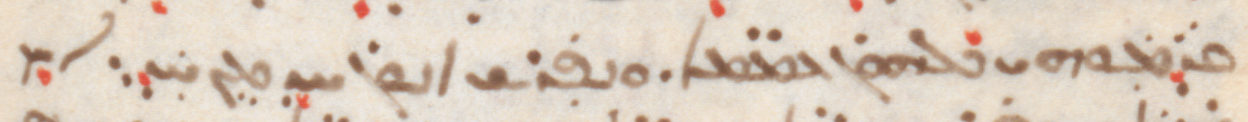ܩܕܡܘܗܝ ܟܠܗܘܢ ܥܡ̈ܡܐ. ܘܢܦܪܫ ܐܢܘܢ ܚܕ ܡܢ ܚܕ ܐܝܟ
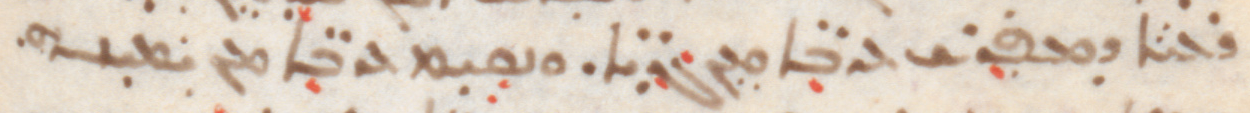ܪܥܝܐ ܕܡܦܪܫ ܥܪ̈ܒܐ ܡܢ ܓܕܝ̈ܐ. ܘܢܩܝ̣ܡ ܥܪ̈ܒܐ ܡܢ ܝܡܝܢܗ
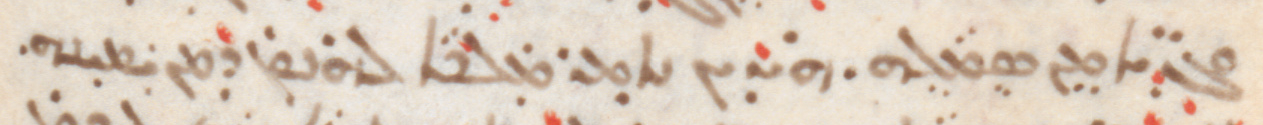ܘܓܕܝ̈ܐ ܡܢ ܣܡܠܗ. ܗܝܕܝܢ ܢܐܡ̣ܪ ܡܠܟܐ ܠܗܢܘܢ ܕܡܢ ܝܡܝܢܗ.
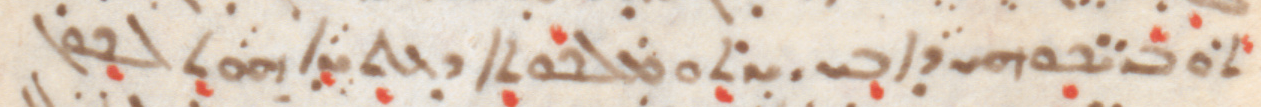ܬܘ ܒܪ̈ܝܟܘܗܝ ܕܐܒܝ ܝܪܬܘ ܡܠܟܘܬܐ ܕܥܬܝܕܐ ܗܘܬ ܠܟܘܢ
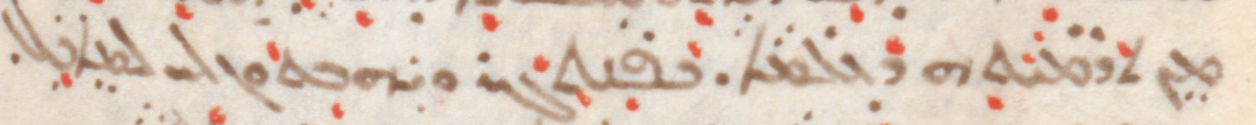ܡܢ ܬܪ̈ܡܝܬܗ ܕܥܠܡܐ. ܟܦܢܬ ܓܝܪ ܘܝܗܒܬܘܢ ܠܝ ܠܡܐܟܠ
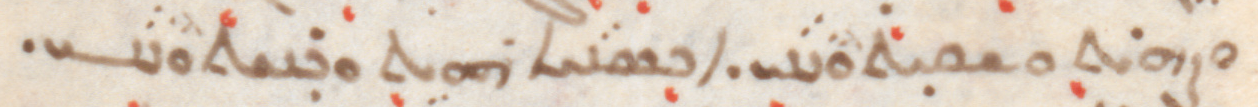ܘܨܗܝܬ ܘܫܩܝܬܘܢܢܝ. ܐܟܣܢܝܐ ܗܘܝܬ ܘܟܢܫܬܘܢܢܝ.
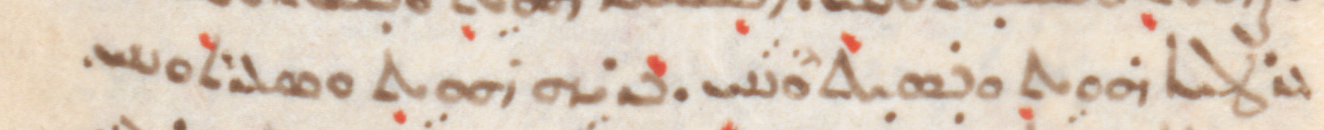ܥܪܛܠܝܐ ܗܘܝܬ ܘܟܣܝܬܘܢܢܝ. ܟܪܝܗ ܗܘܝܬ ܘܣܥܪܬܘܢܢܝ
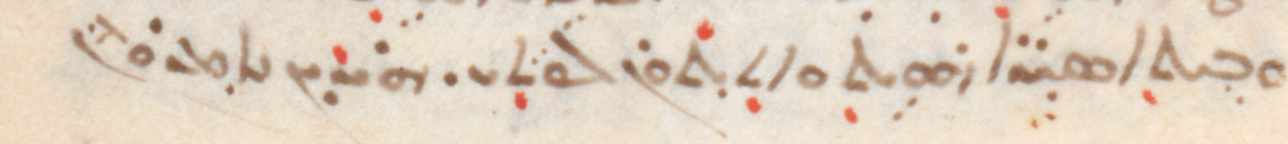ܘܒܝܬ ܐܣܝܪ̈ܐ ܗܘܝܬ ܘܐܬܝܬܘܢ ܠܘܬܝ. ܗܝܕܝܢ ܢܐ̣ܡܪ
